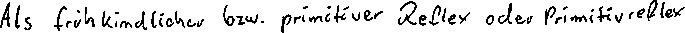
Als frühkindlicher bzw. primitiver Reflex oder Primitivreflex
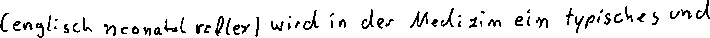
(englisch neonatal reflex) wird in der Medizin ein typisches und
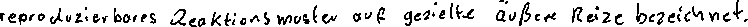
reproduzierbares Reaktionsmuster auf gezielte äußere Reize bezeichnet.
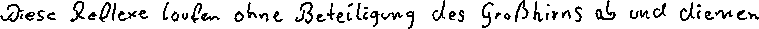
Diese Reflexe laufen ohne Beteiligung des Großhirns ab und dienen
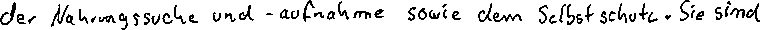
der Nahrungssuche und -aufnahme sowie dem Selbstschutz. Sie sind
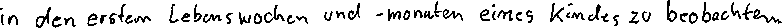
in den ersten Lebenswochen und -monaten eines Kindes zu beobachten
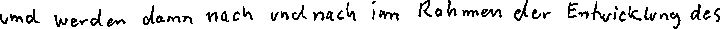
und werden dann nach und nach im Rahmen der Entwicklung des
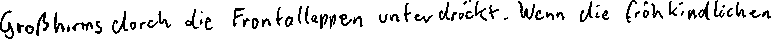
Großhirns durch die Frontallappen unterdrückt. Wenn die frühkindlichen
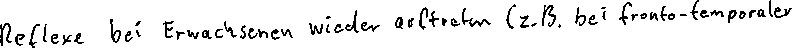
Reflexe bei Erwachsenen wieder auftreten (z. B. bei fronto-temporaler
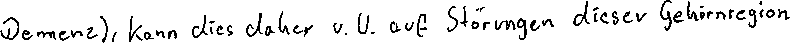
Demenz), kann dies daher u. U. auf Störungen dieser Gehirnregion
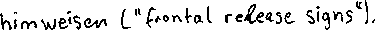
hinweisen ("frontal release signs").
